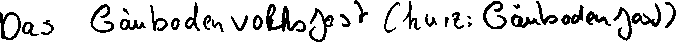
Das Gäubodenvolksfest (kurz: Gäubodenfest)
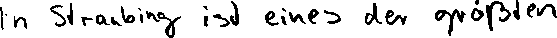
in Straubing ist eines der größten
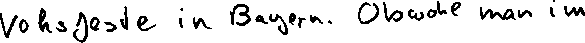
Volksfeste in Bayern. Obwohl man im
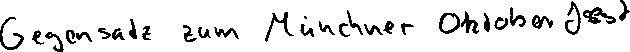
Gegensatz zum Münchner Oktoberfest
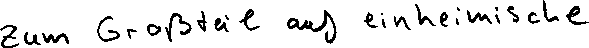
zum Großteil auf einheimische
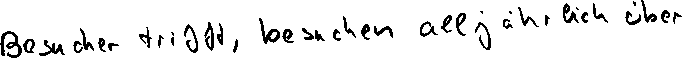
Besucher trifft, besuchen alljährlich über
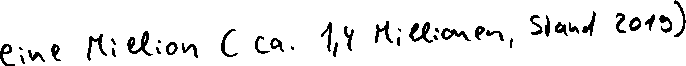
über eine Million (ca. 1,4 Millionen, Stand 2019)
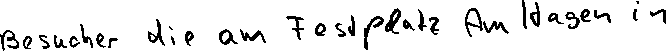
Besucher die am Festplatz Am Hagen in
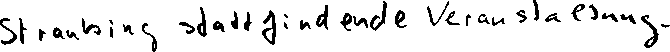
Straubing stattfindende Veranstaltung.
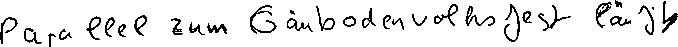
Parallel zum Gäubodenvolksfest läuft
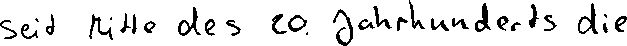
seit Mitte des 20. Jahrhunderts die
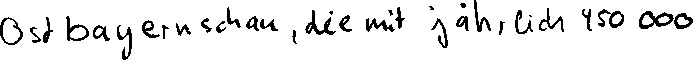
Ostbayernschau, die mit jährlich 450.000
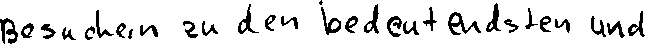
Besuchern zu den bedeutendsten und
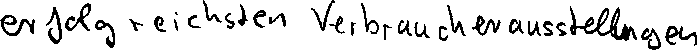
erfolgreichsten Verbraucherausstellungen
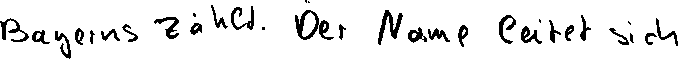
Bayerns zählt. Der Name leitet sich
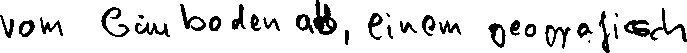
vom Gäuboden ab, einem geografisch
